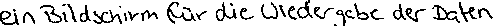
ein Bildschirm für die Wiedergabe der Daten
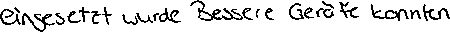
eingesetzt wurde. Bessere Geräte konnten
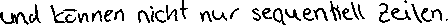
und können nicht nur sequentiell Zeilen
